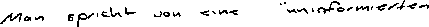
Man spricht von einem "uninformierten
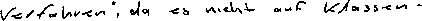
Verfahren", da es nicht auf Klassen-
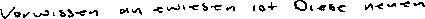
Vorwissen angewiesen ist. Diese neuen
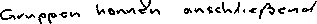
Gruppen können anschließend
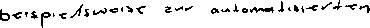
beispielsweise zur automatisierten
